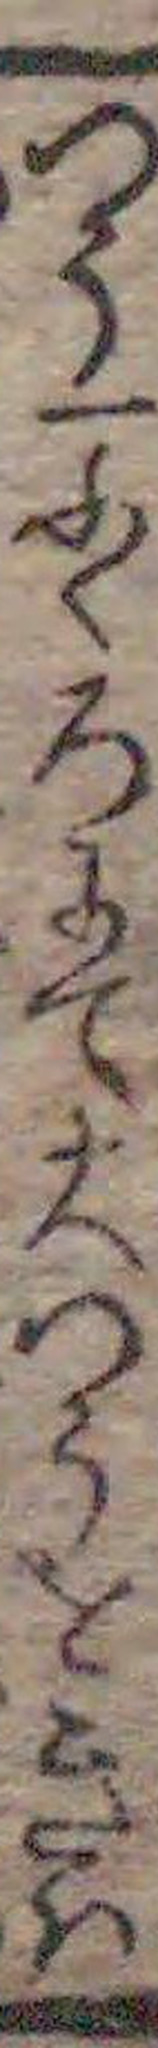つう一ふくろにて大つうをきは
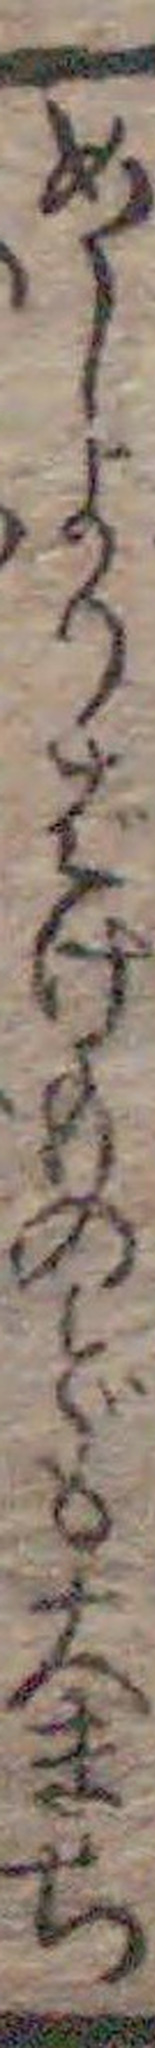めしよりばけものども大まち
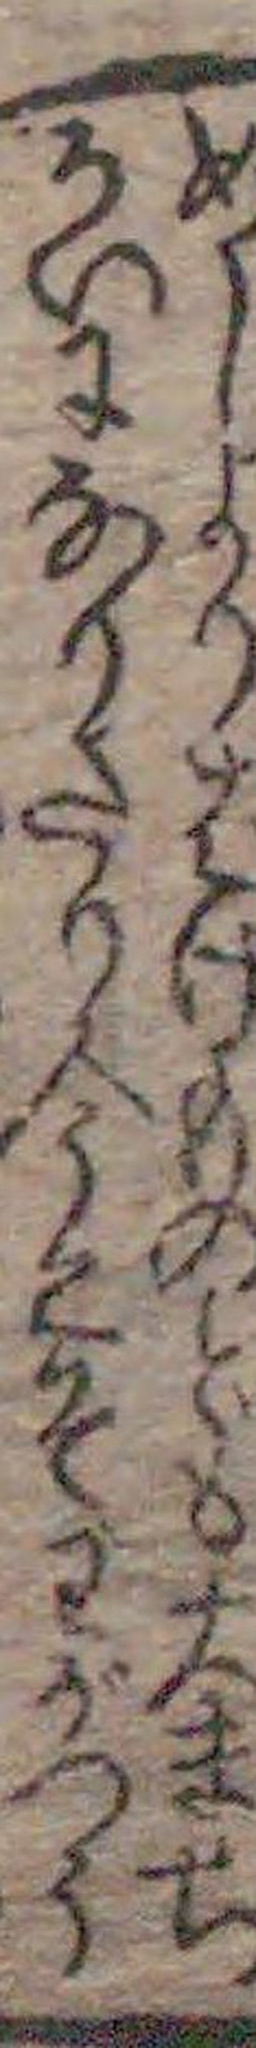かいになりたり今こそわがつう
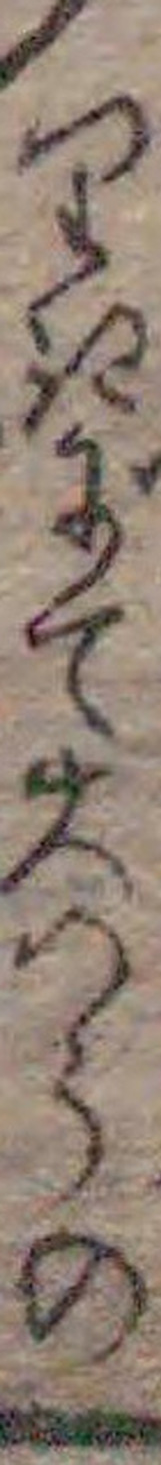りきにて大つうの
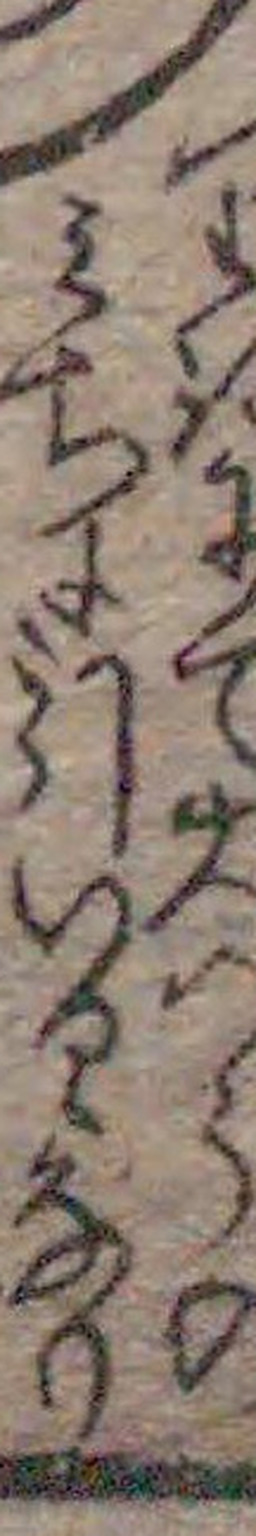みちに引いるゝなり
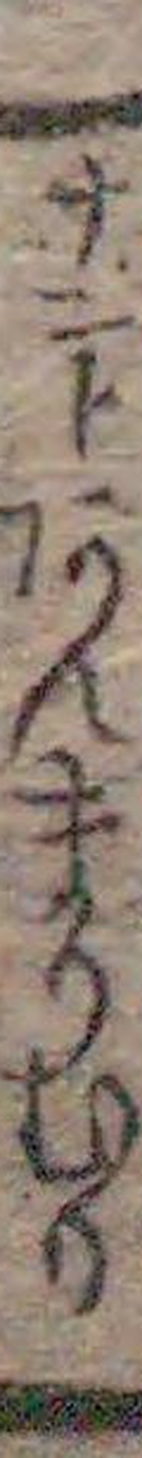ナントあんまりむり
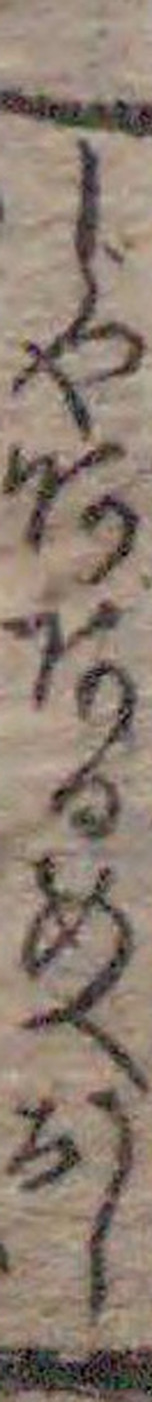じやああるめへおし
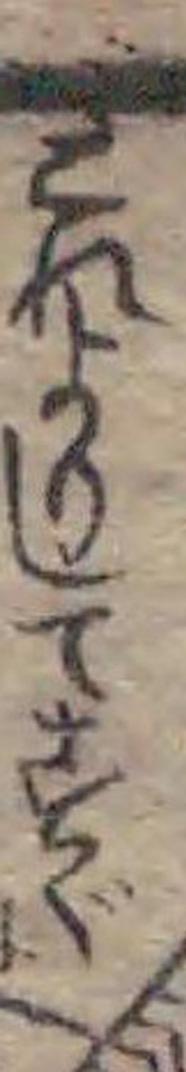これよりしてすぐ
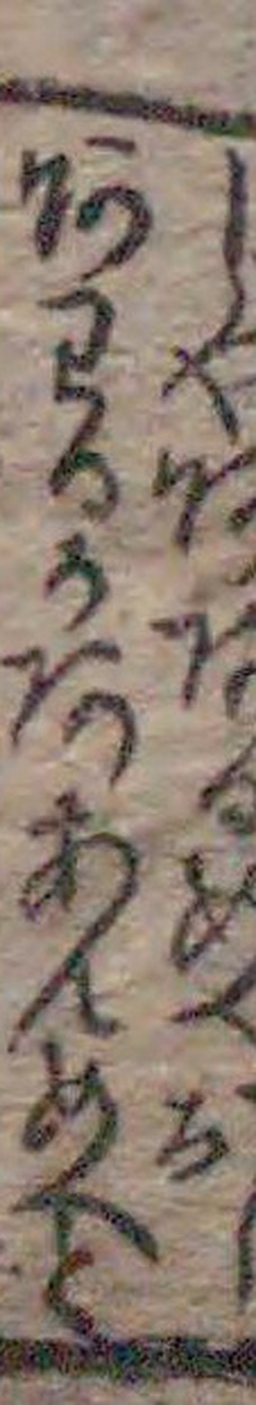あわるかあんめへと
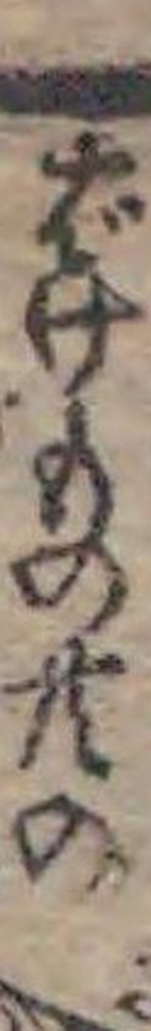ばけもの共の
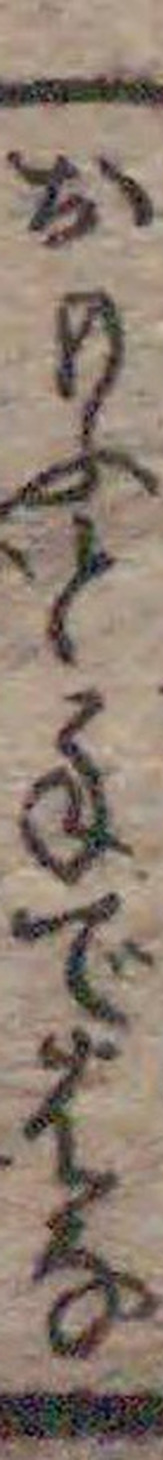おもふと手ではな
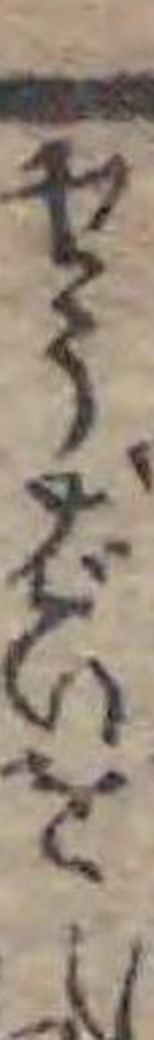せうばいを
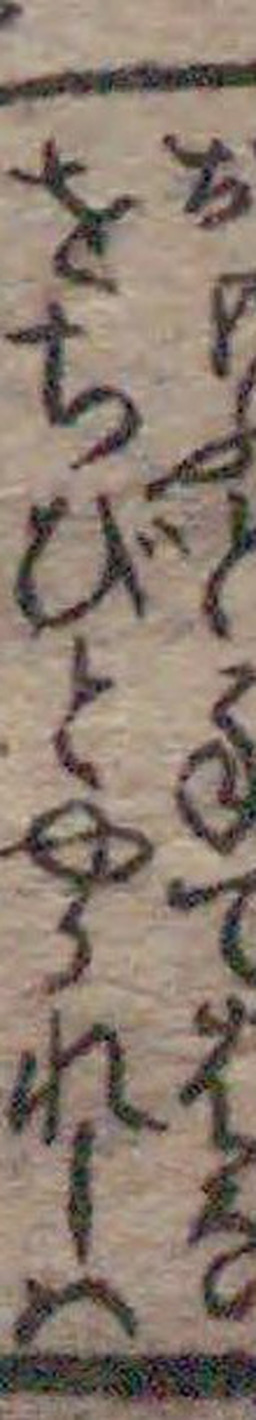をちびとやられしは
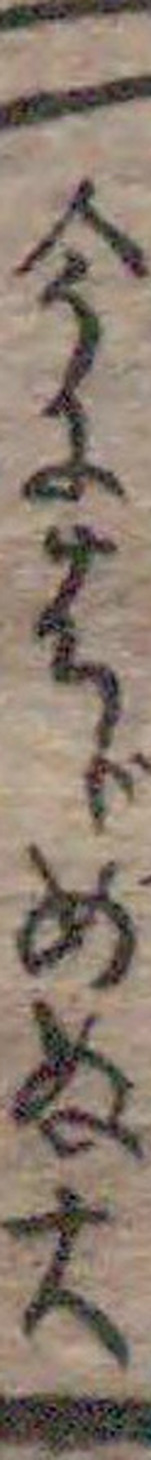今にはじめぬ大
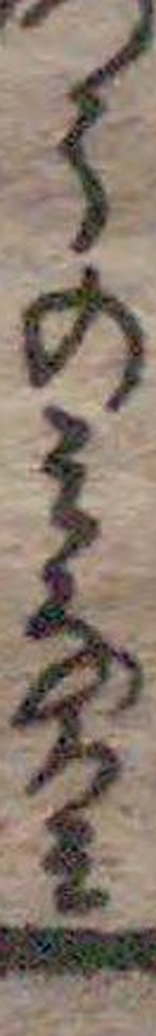つうのみなかみ
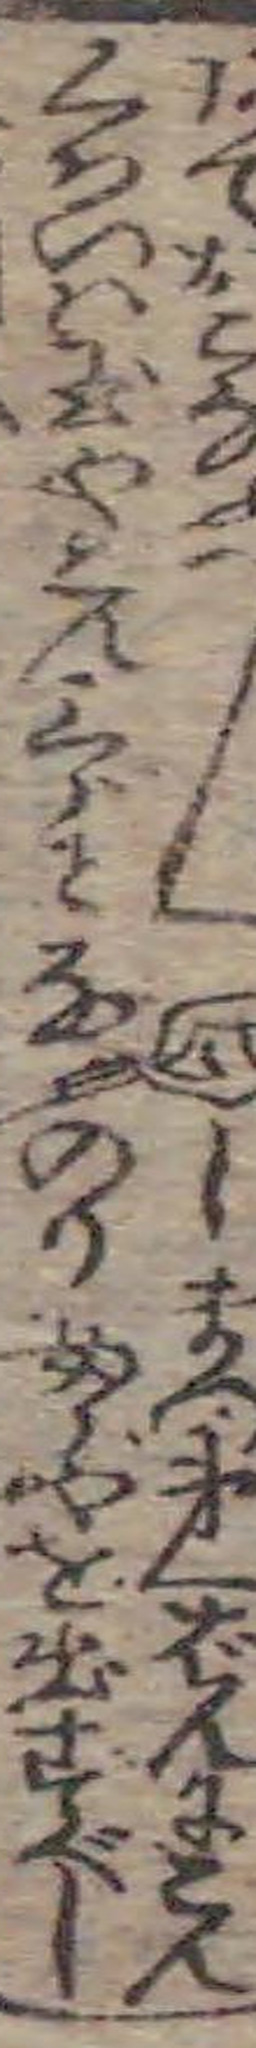くはいは玉やこん三郎となのり女郎やを出すべし
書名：化物楽屋異牒 : 2巻
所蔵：国立国会図書館 National Diet Library, JAPAN
